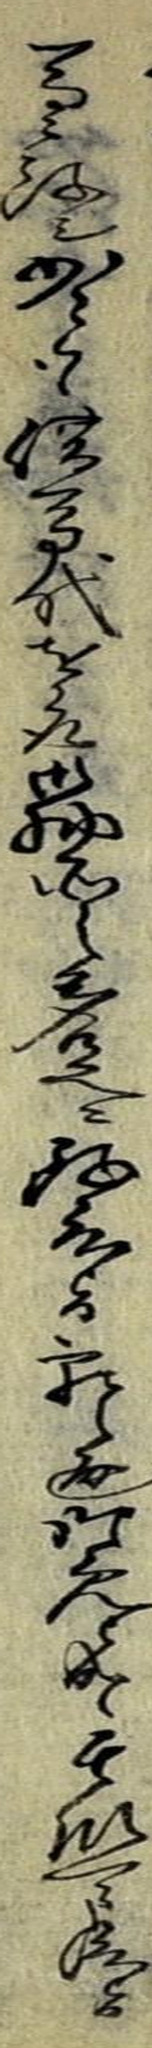馬ニ致シ少々ツヽ借馬代を取御納所之多足ニ致度旨願之通御免被成候其段可被申渡旨
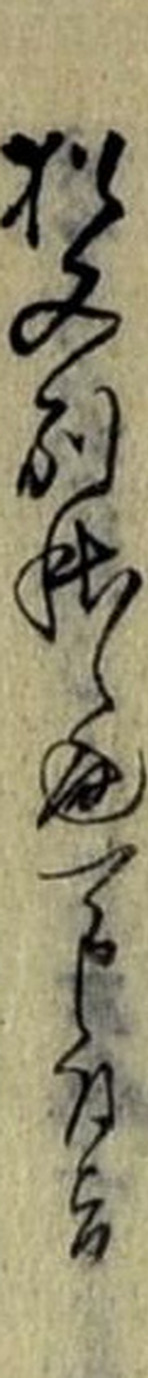猶又別紙之通可申付旨
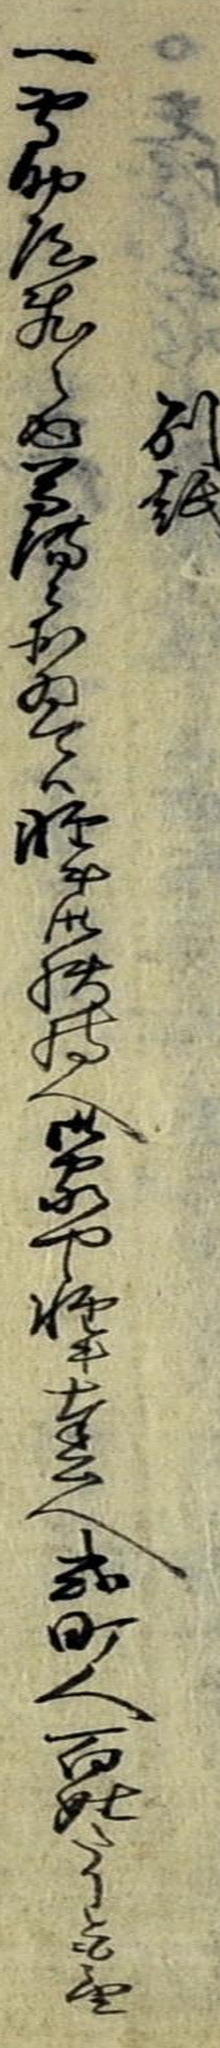一専助屋敷之内馬場ニおゐてハ軽キ御扶持人御家中軽キ奉公人或町人百姓たりとも望
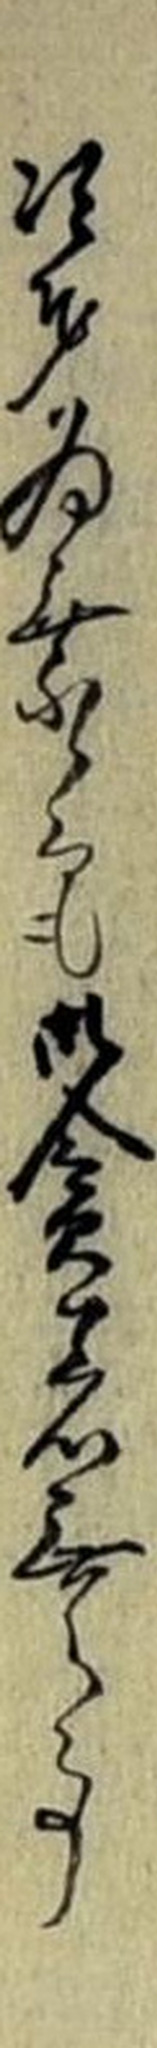次第為乗候而も御貪着無之事
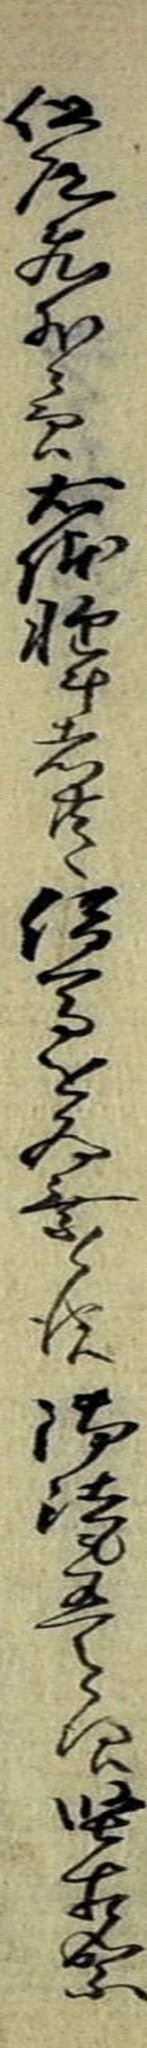但屋敷外ニ而ハ右体軽キ者共へ借馬を為乗候儀ハ御法も有之候得ハ堅相成不
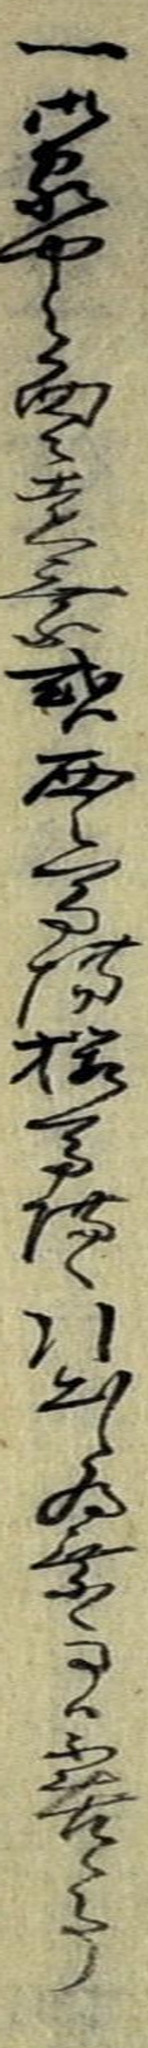一御家中之面々遠乗或ハ西之馬場桜馬場へ引出し為乗候事ハ不苦候事
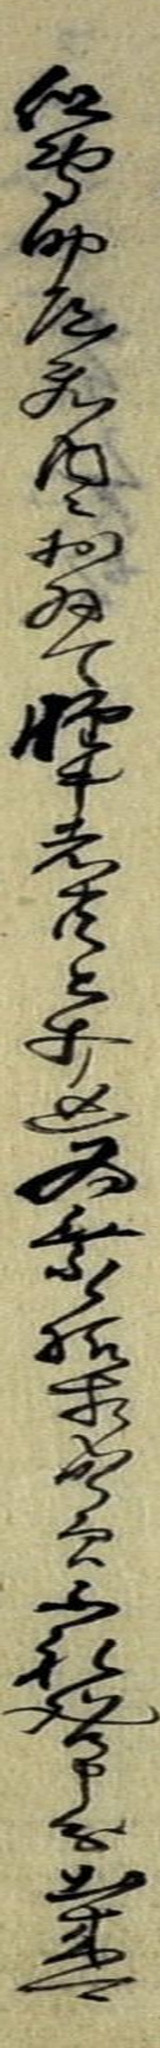但専助屋敷内ニおゐて軽キ者共と打込為乗候様相成候而ハ不礼咎申義出来可
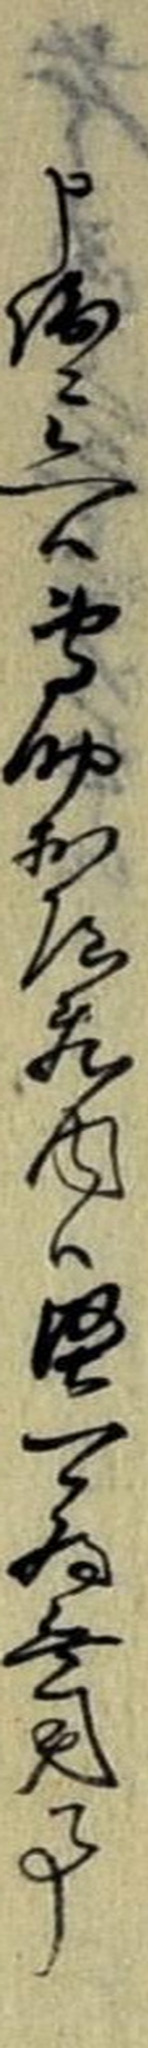申儀ニ候ヘハ専助於屋敷内ハ堅可為無用事
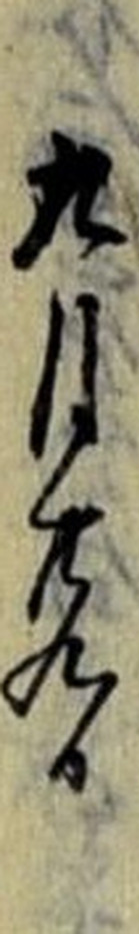九月廿九日
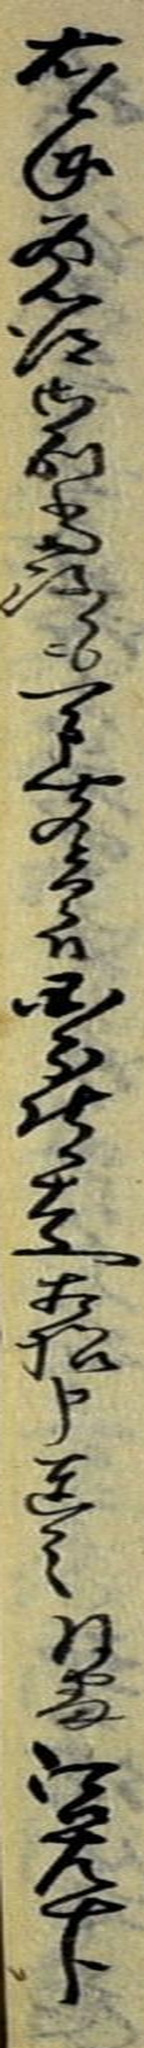右之趣為心得御別当役へも可申聞旨ニ付国分次郎大夫相招申達之月番江口左十郎
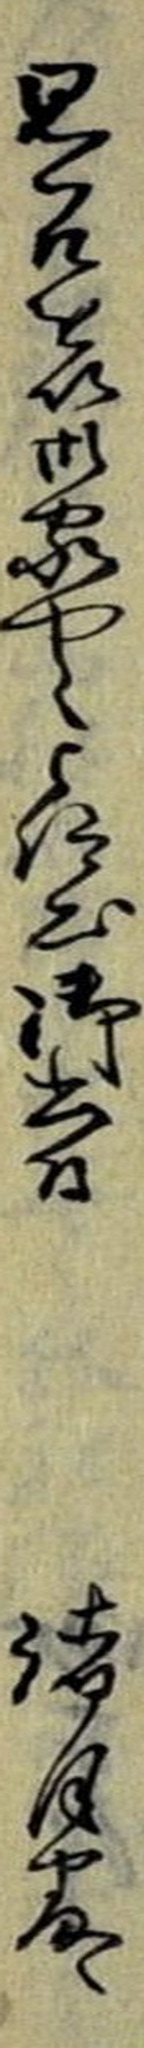思召を以御家中へ被仰出御書付諸月番へ
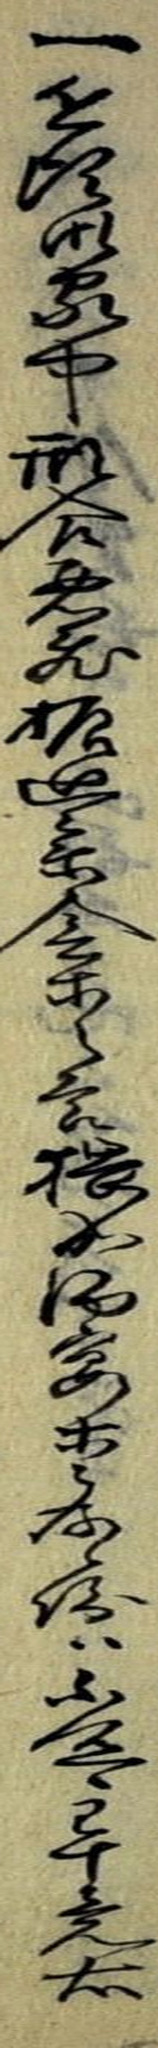一近頃御家中形合悪敷振廻集会等之節猥成酒宴等ニ及候儀ハ不宜候畢竟右
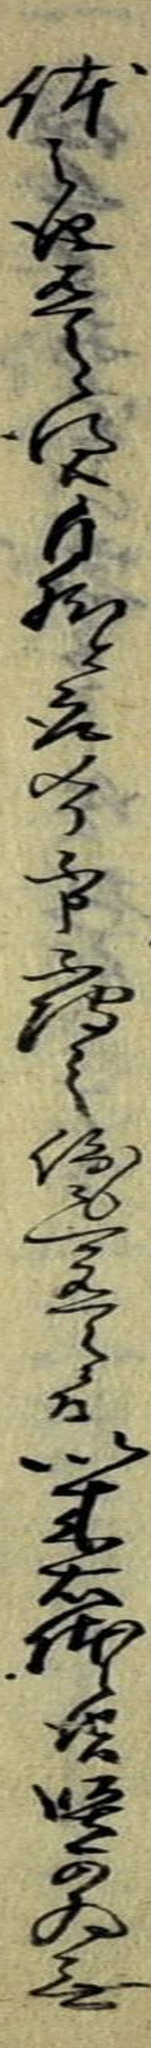体之儀有之候得ハ自然と取〆り不申不埒之儀も可有之候ニ付以来体之儀ハ堅可為無
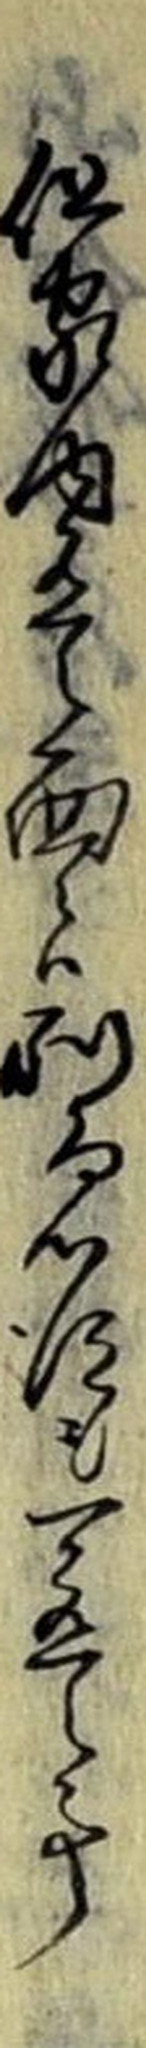但家内有之面々ハ別而心得も可有之事
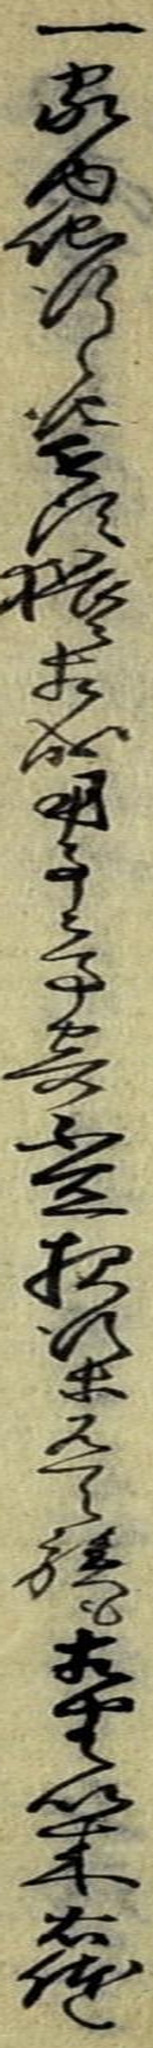一家内他行之儀近頃猥ニ相成用事ニ事寄不宜夜行等有之族も相聞候以来右体之
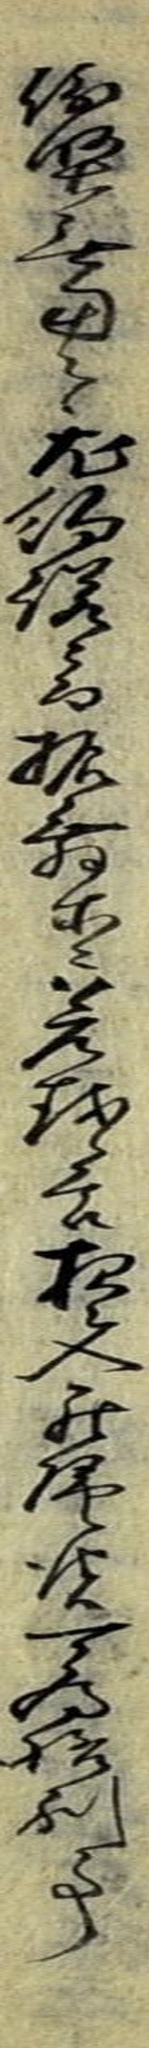儀堅無用ニ候尤役儀ニ而振舞等ニ差越候節夜ニ入罷帰候儀ハ可為格別事
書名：命令之部 三
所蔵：福井県文書館 Fukui Prefectural Archives
